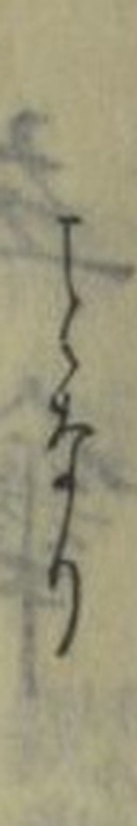ことなり
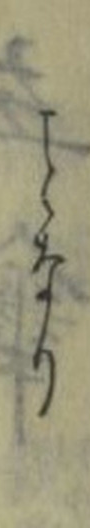ことなり
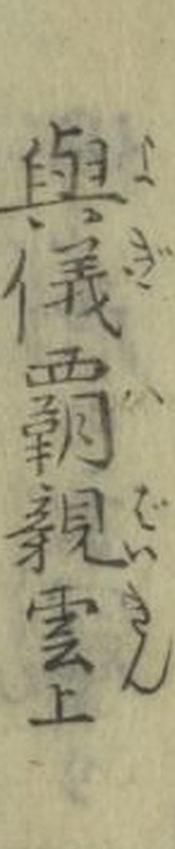與儀覇親雲上
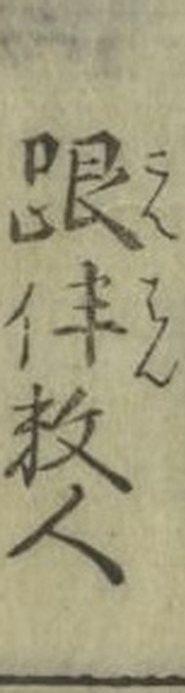跟伴数人
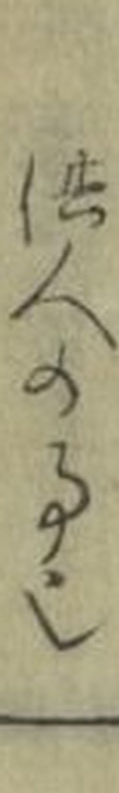供人の事也

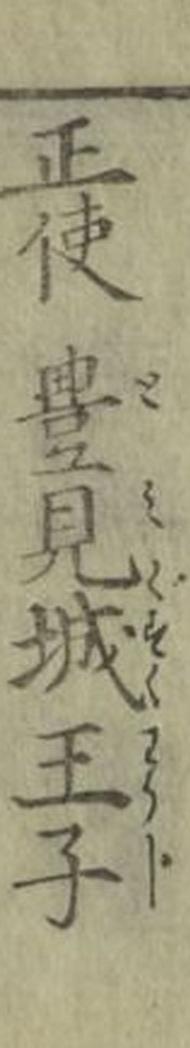正使豊見城王子
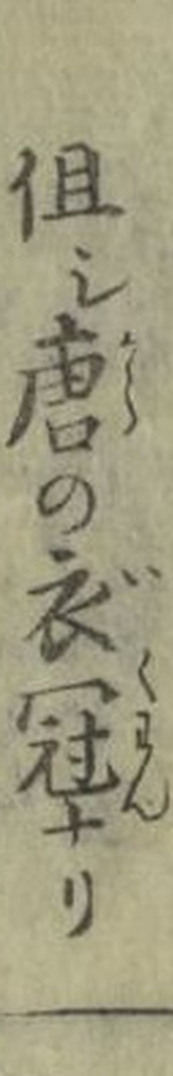但シ唐の衣冠ナリ
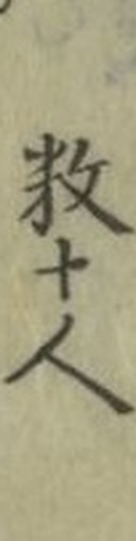数十人
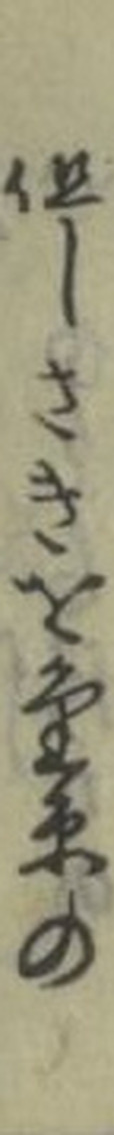但しさきを金糸の
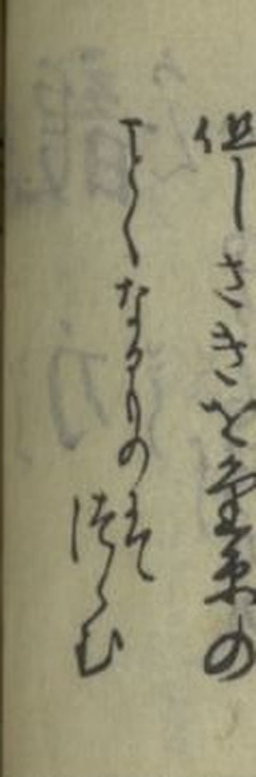ことくなるものにて
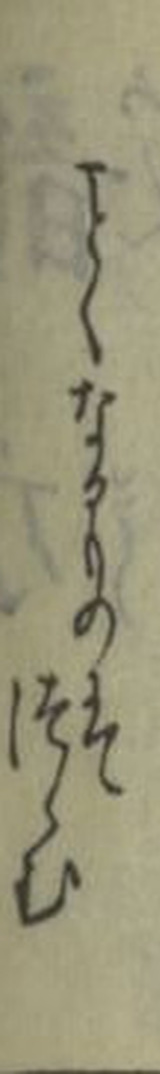ことくなるものにて
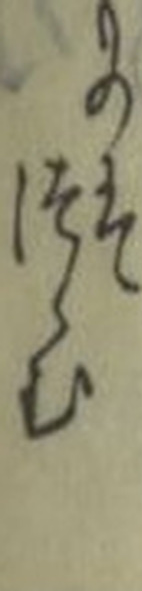つゝむ
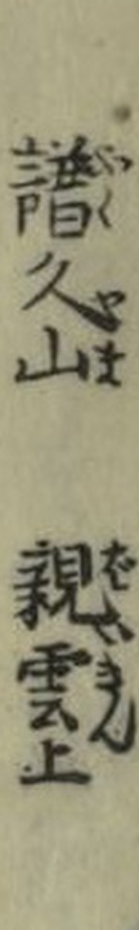譜久山親雲上
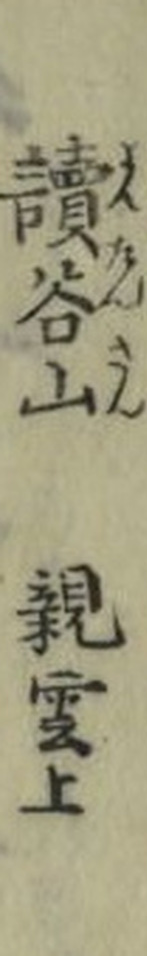読谷山親雲上
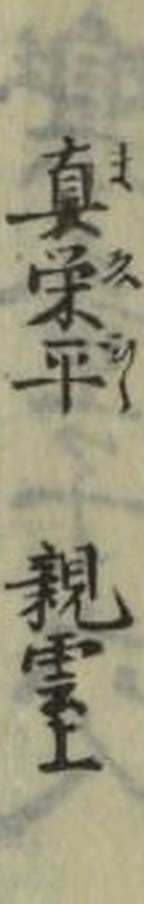真栄平親雲上
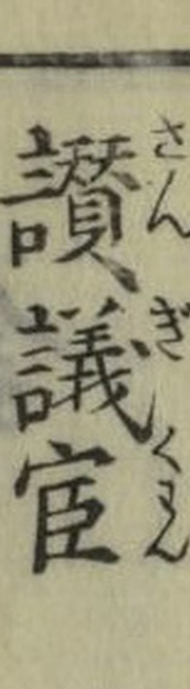讃議宦
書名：琉球人行列記
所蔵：University of the Ryukyus Library
